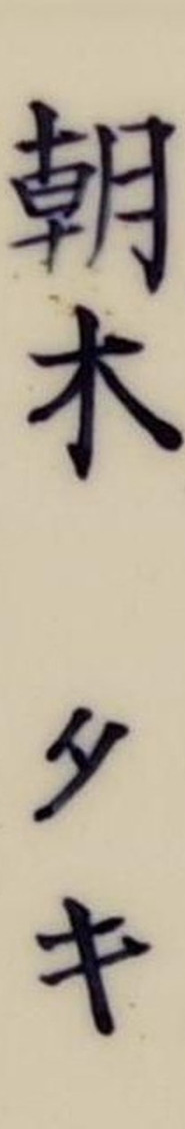朝木タキ
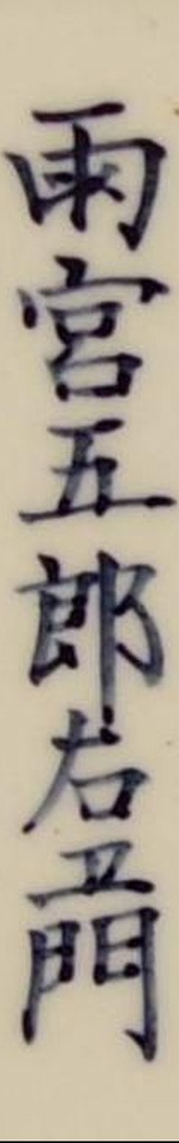雨宮五郎右ヱ門
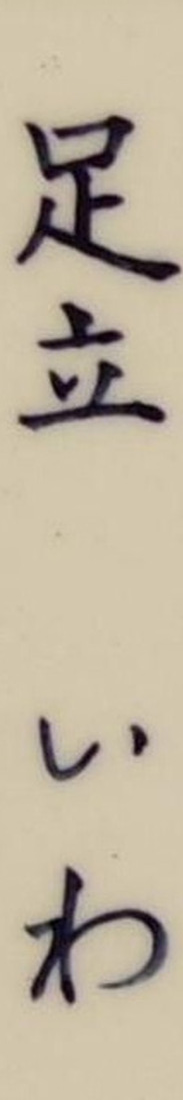足立いわ
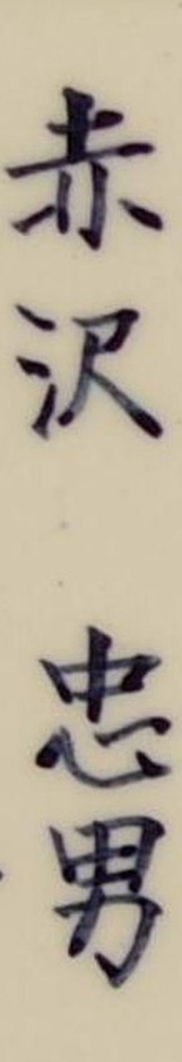赤沢忠男
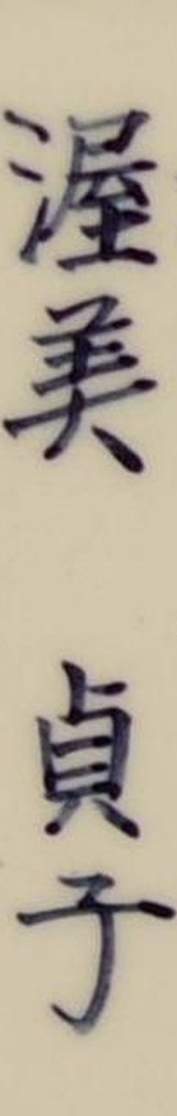渥美貞子
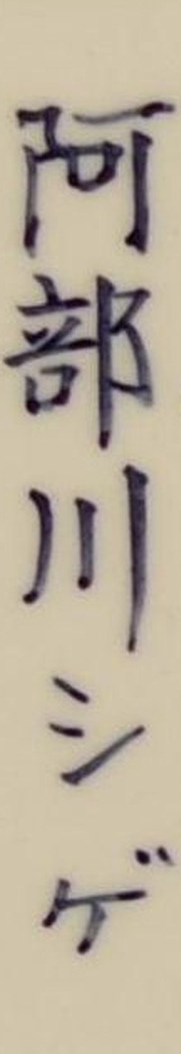阿部川シゲ
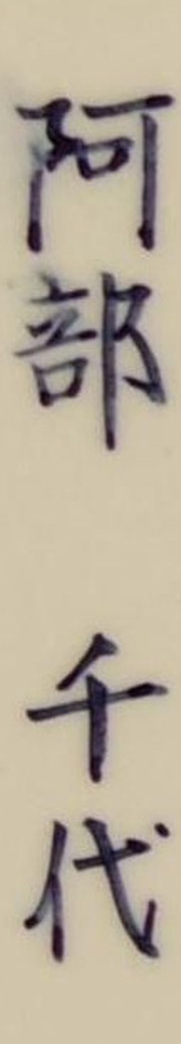阿部千代
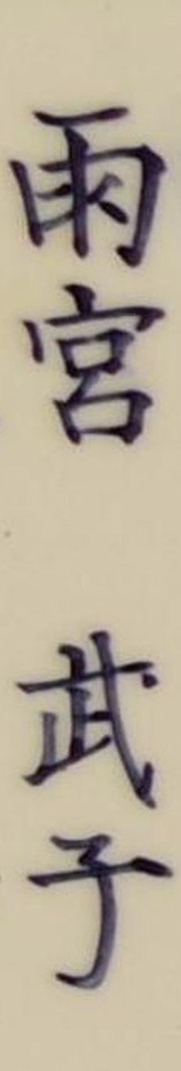雨宮武子
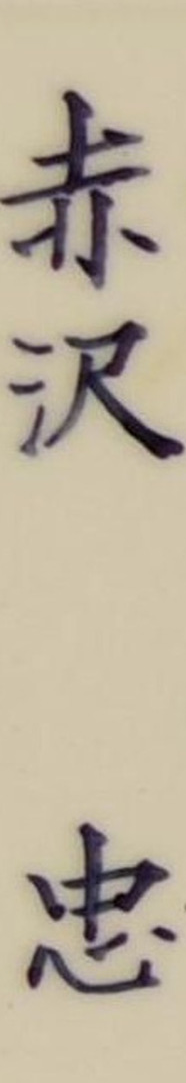赤沢忠
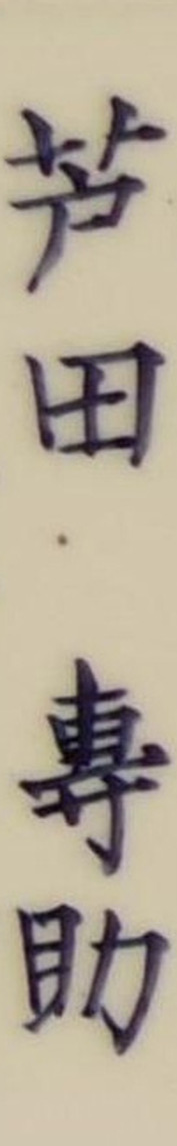芦田専助
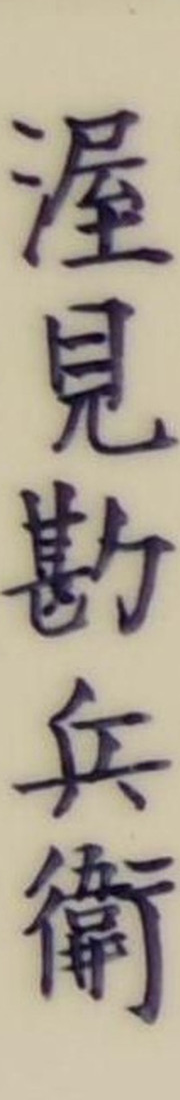渥見勘兵衛
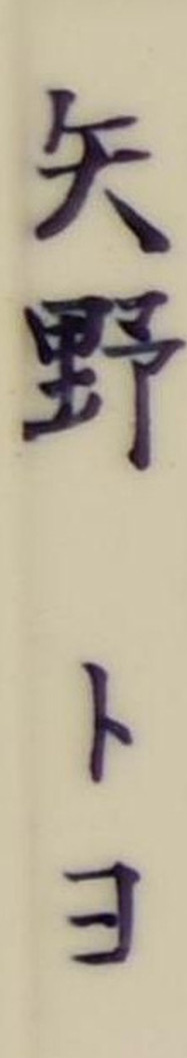矢野トヨ

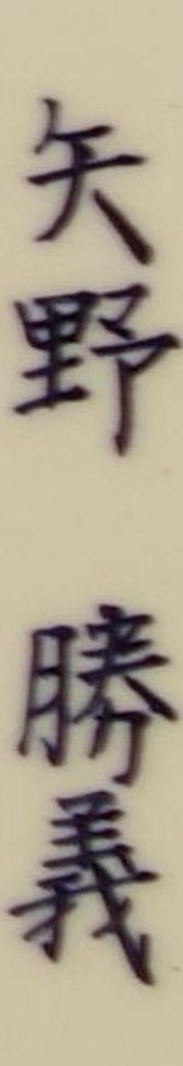矢野勝義
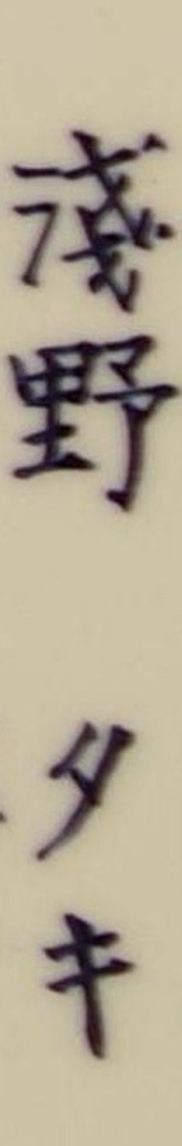浅野タキ
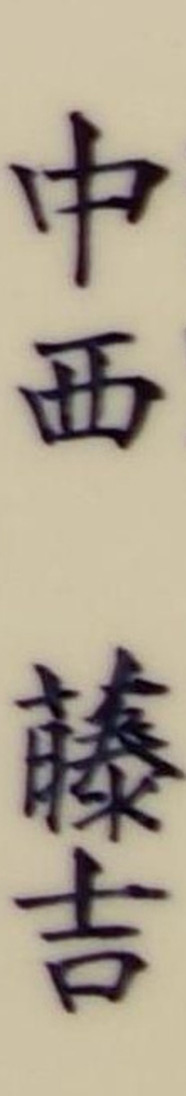中西藤吉
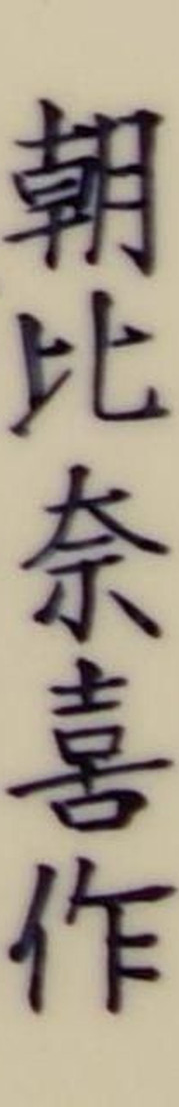朝比奈喜作
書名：E~L
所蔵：高野山金剛峯寺
